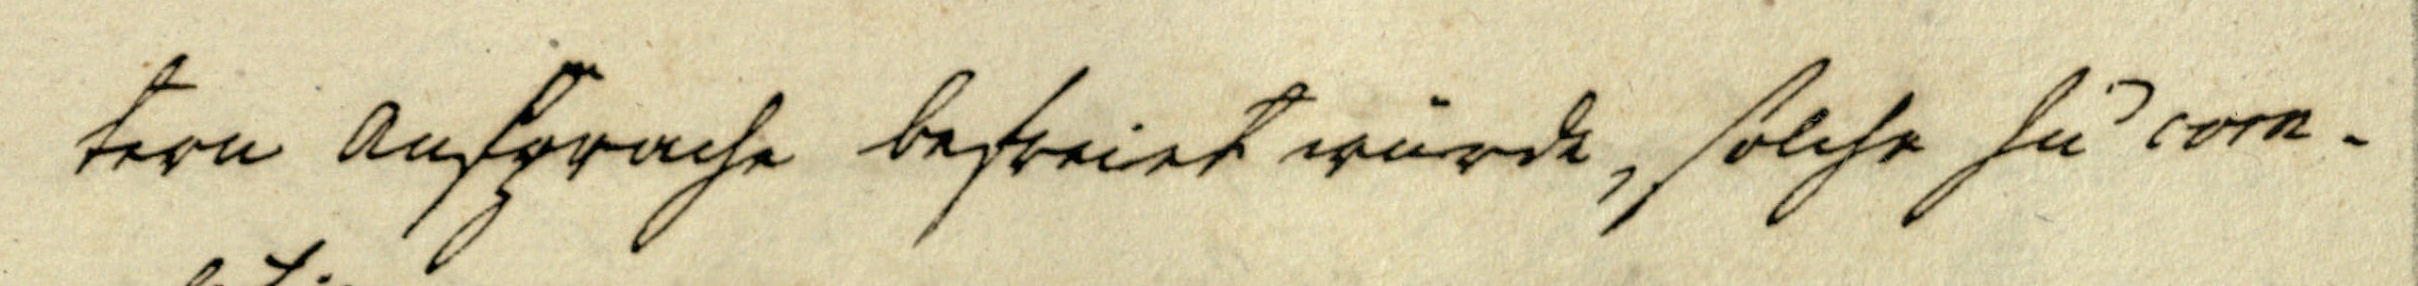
tern Ansprache befreiet würde, solche zu com¬
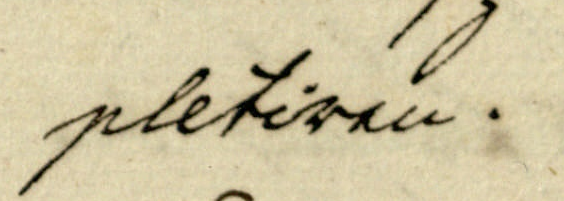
pletiren.
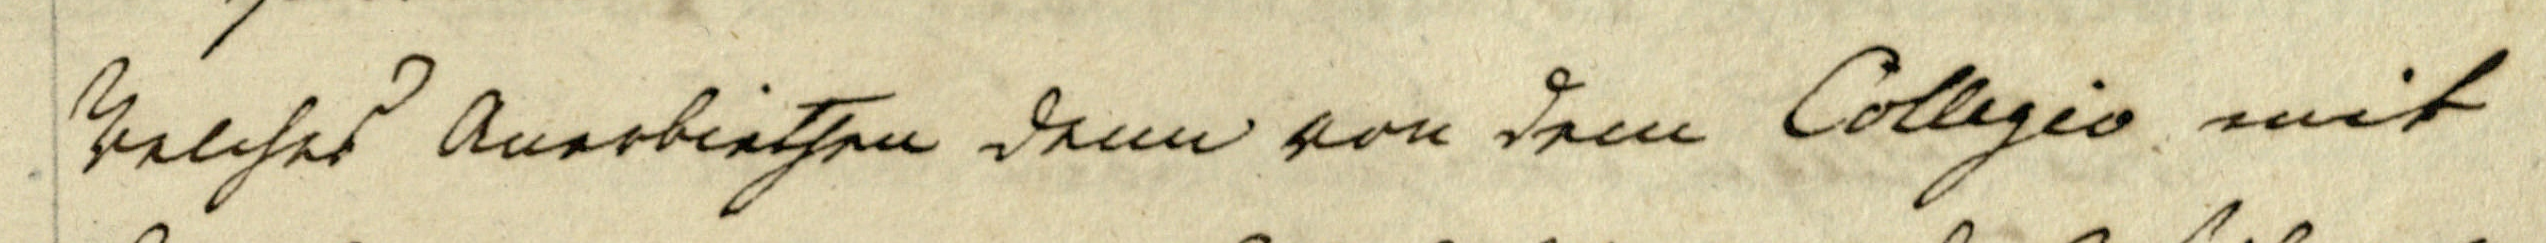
Welches Anerbiethen denn von dem Collegio mit
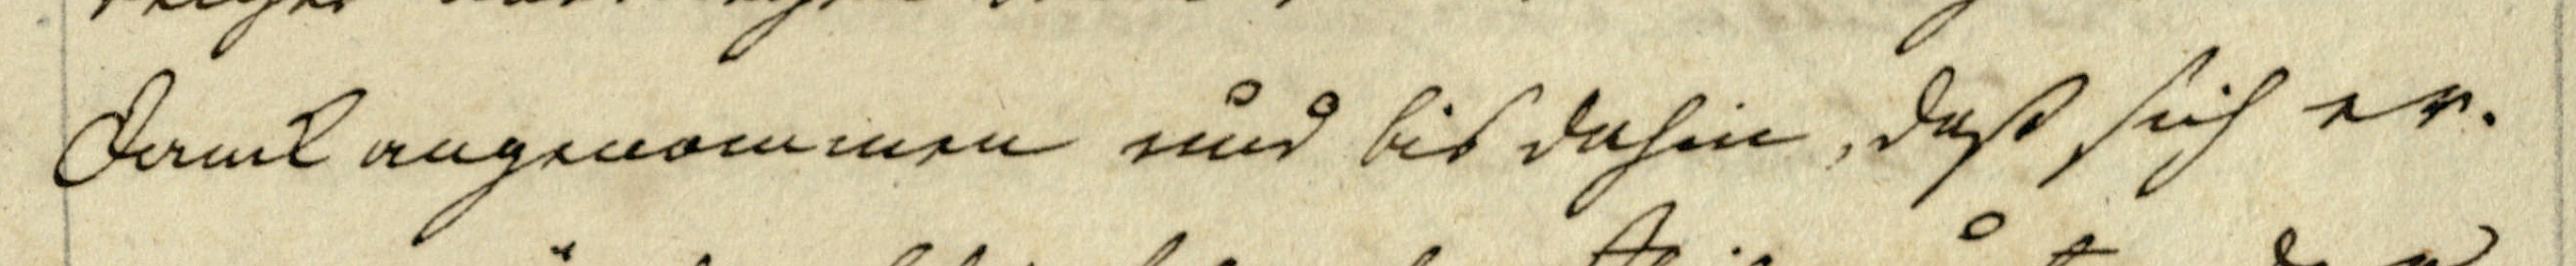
Danck angenommen und bis dahin, daß sich er¬
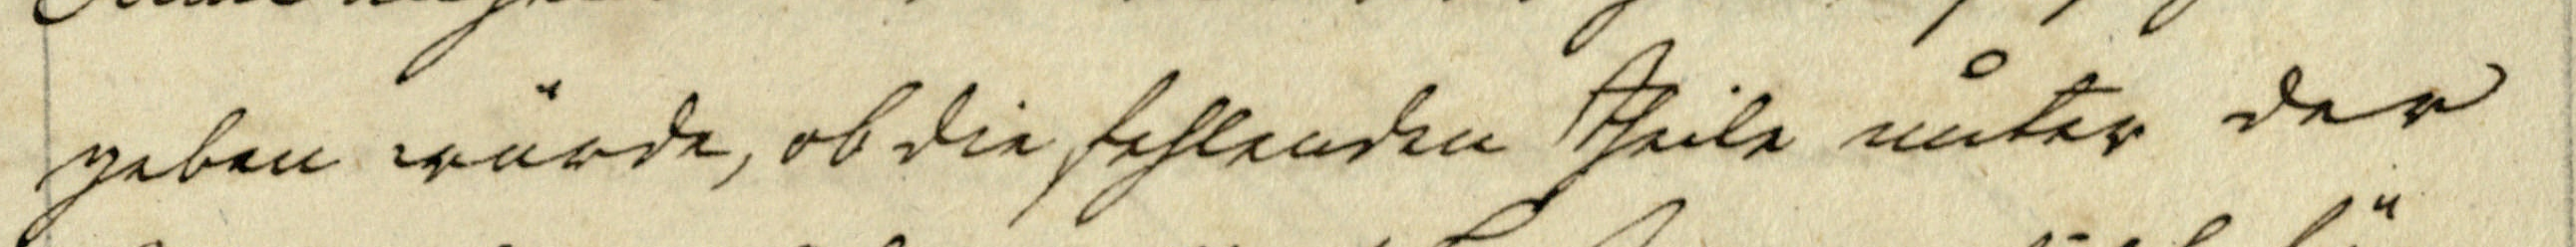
geben würde, ob die fehlenden Theile unter der
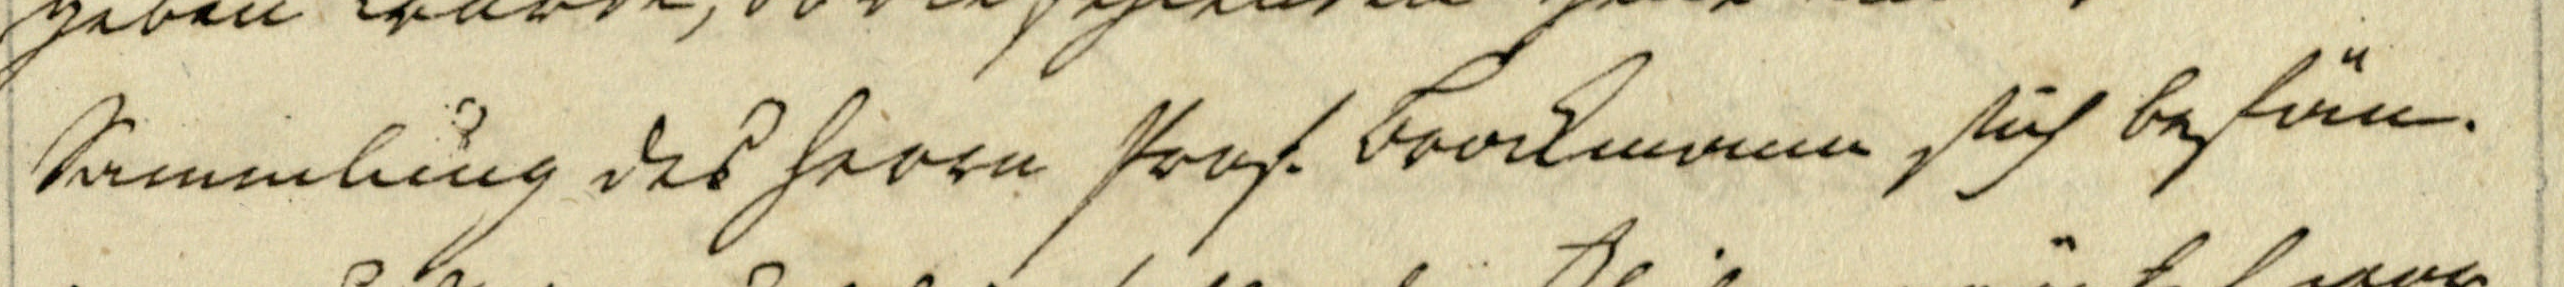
Sammlung des Herrn Prof. Brockmann sich befän¬
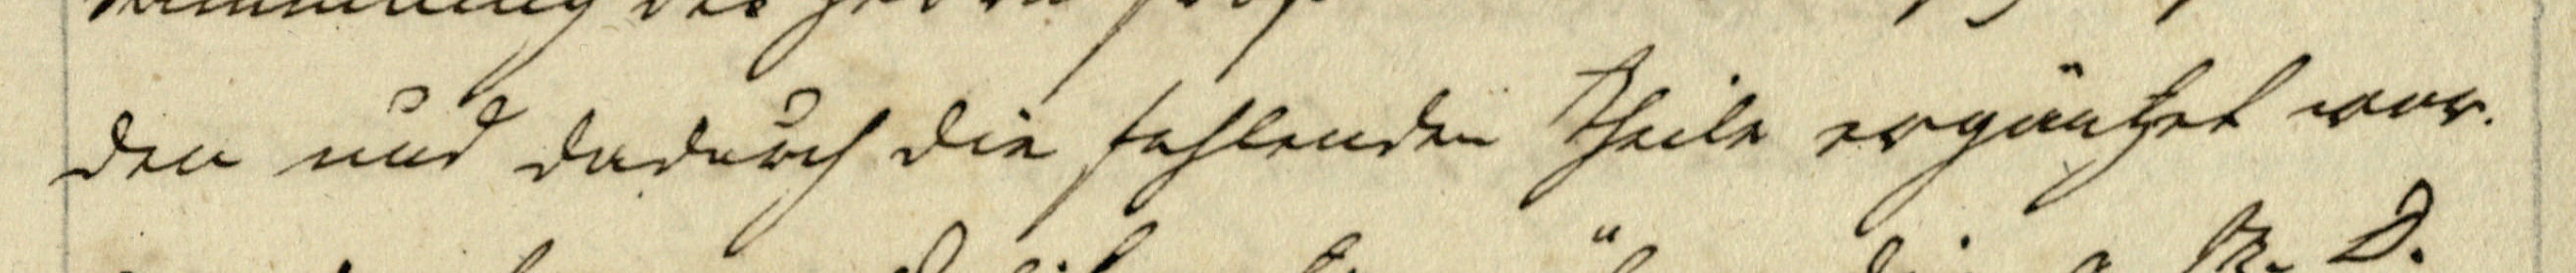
den und dadurch die fehlenden Theile ergäntzet wor¬
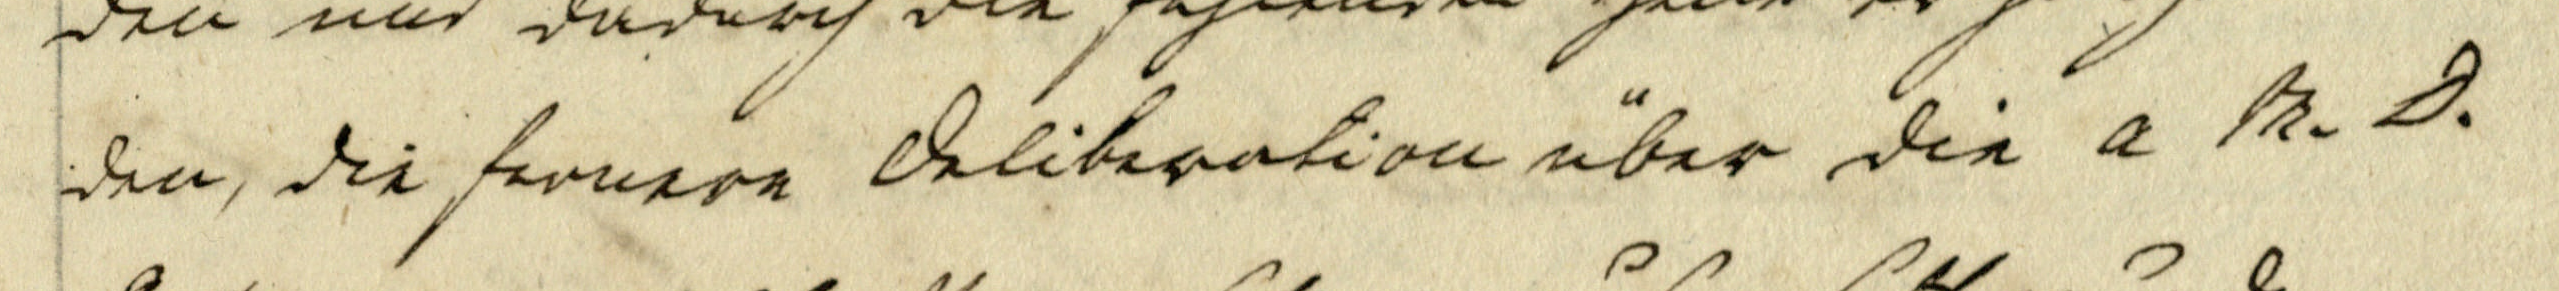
den, die fernere Deliberation über die a M. D.
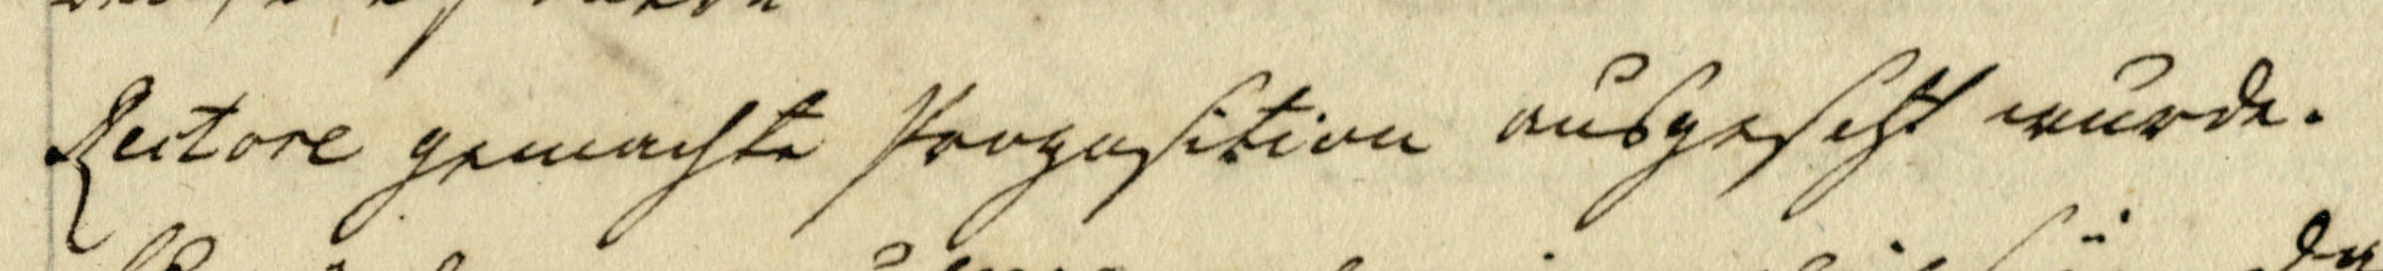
Rectore gemachte Proposition ausgesetzt wurde.
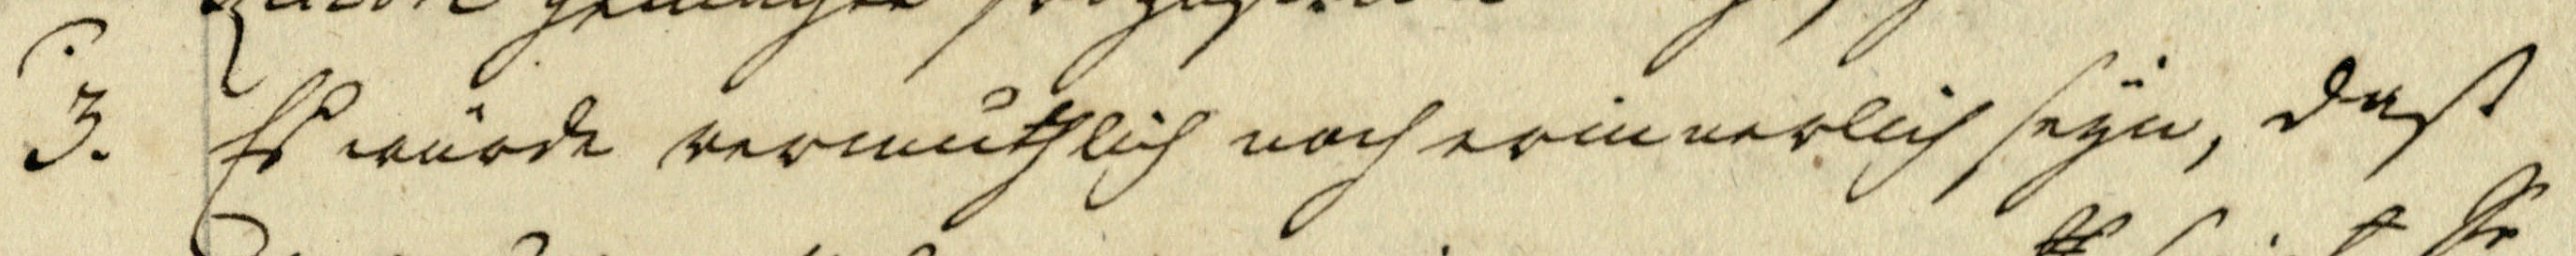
3. Es würde vermuthlich noch erinnerlich seÿn, daß
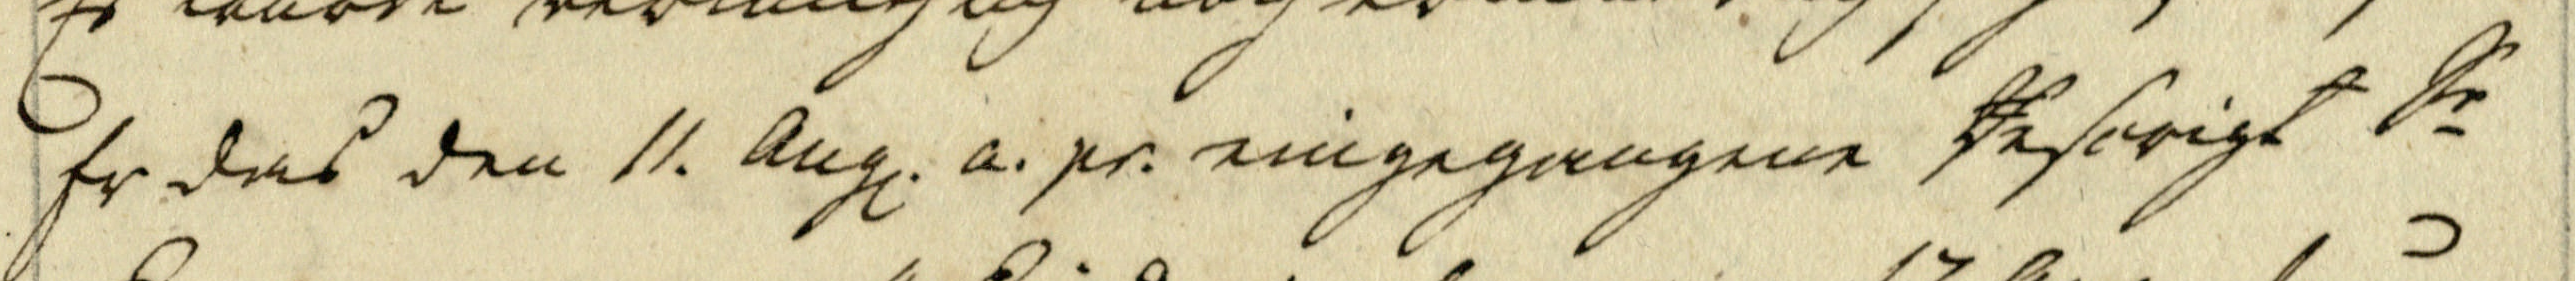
Er das den 11. Aug. a. pr. eingegangene Rescript Sr
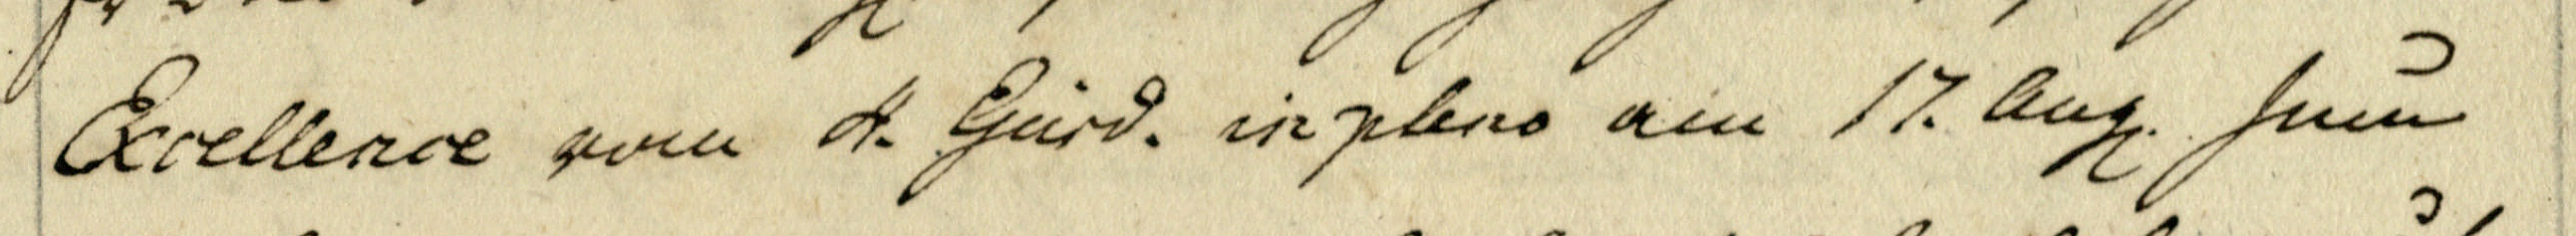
Excellence vom 4. Ejusd. in pleno am 17. Aug. zum
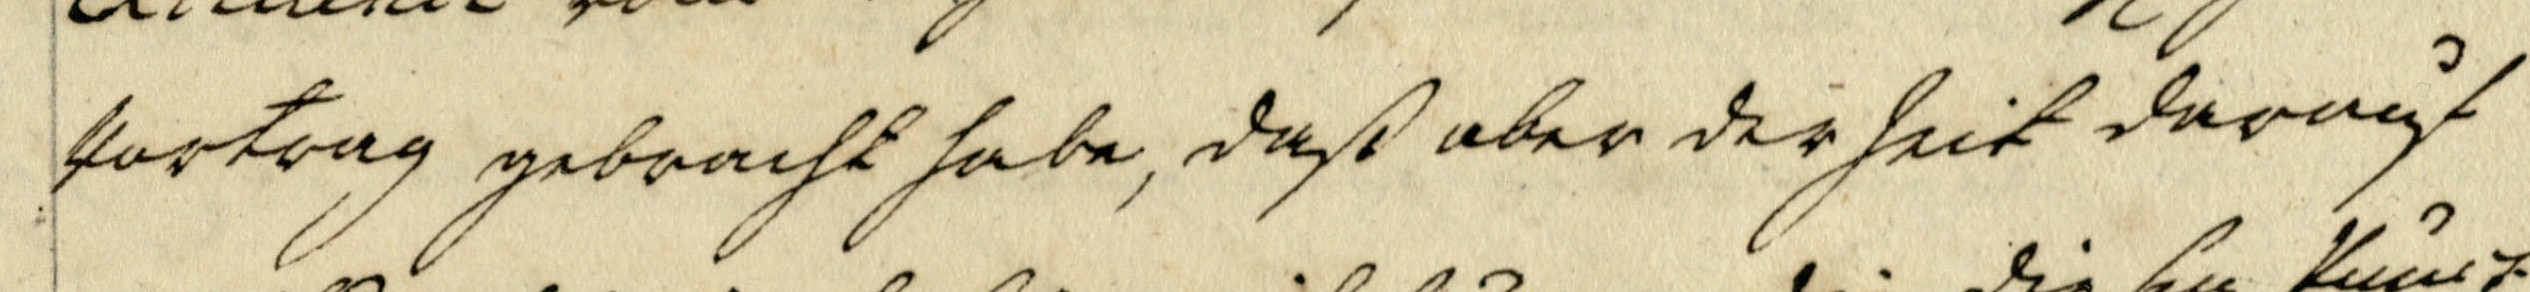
Vortrag gebracht habe, daß aber der Zeit darauf
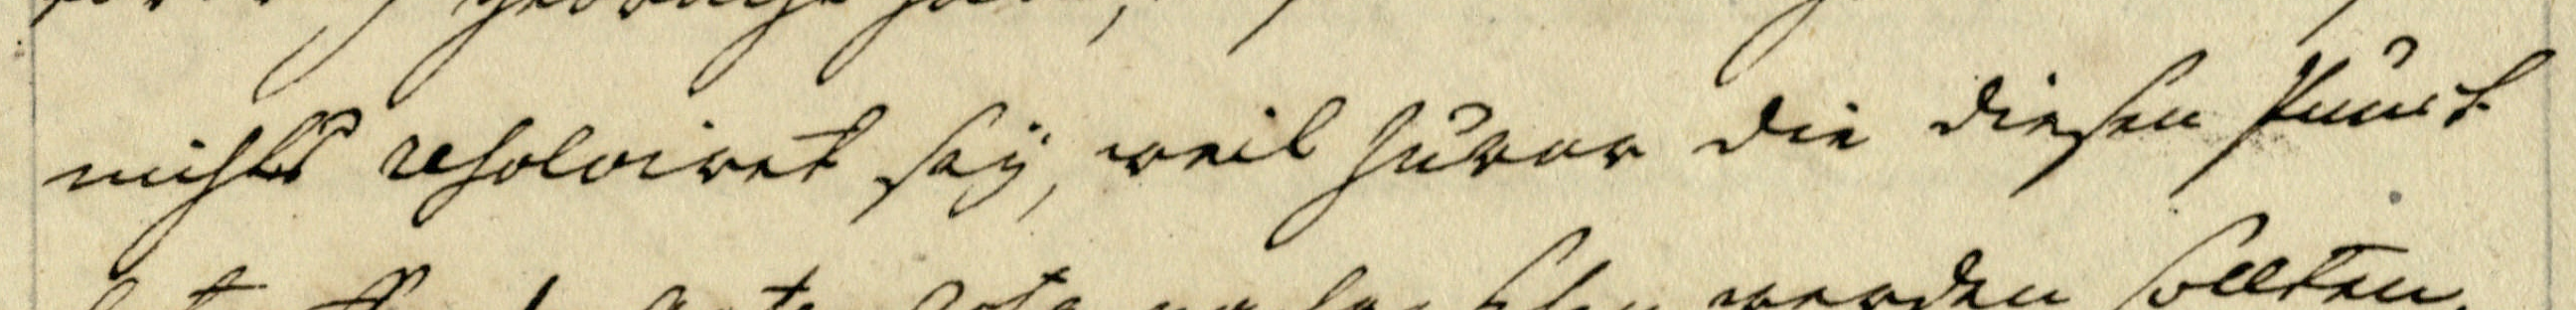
nichts resolviret seÿ, weil zuvor die diesen Punct
